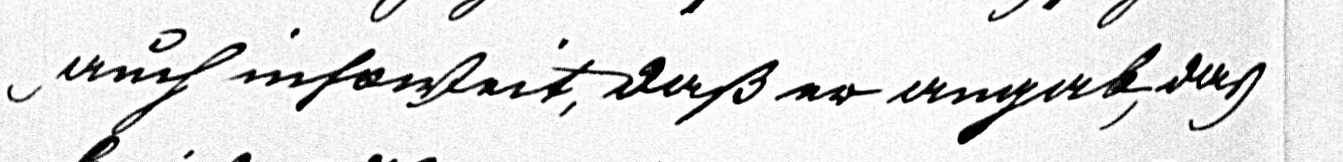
auch insoweit, daß er angab, das
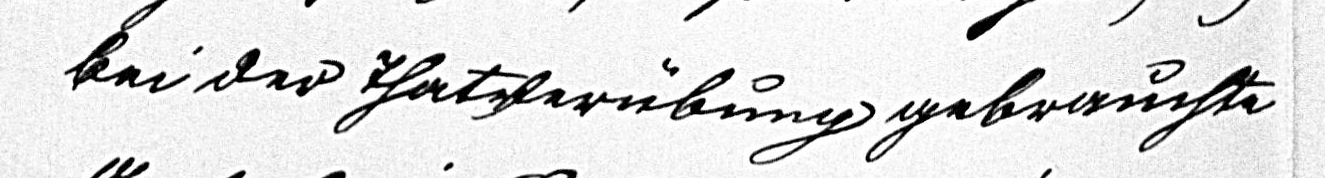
bei der Thawerübung gebrauchte
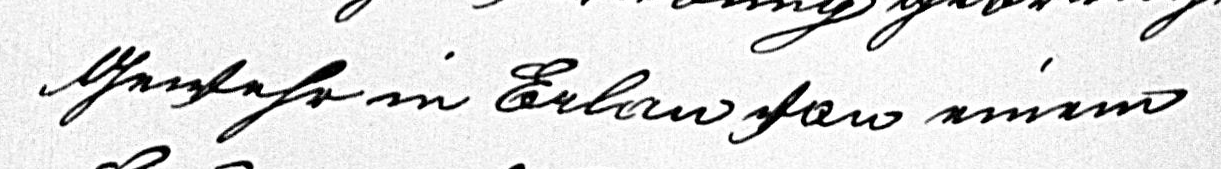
Gewehr in Erlan von einem
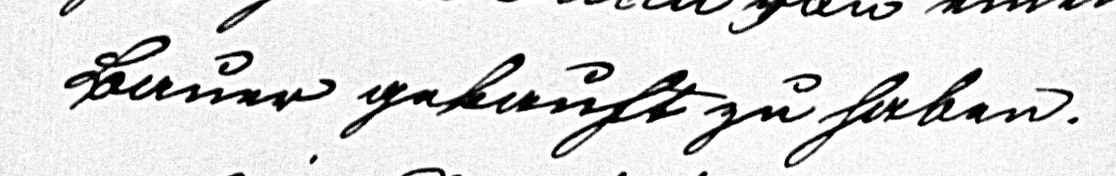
Bauer gekauft zu haben.
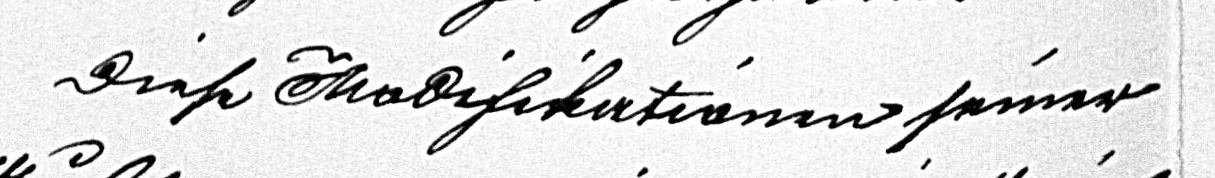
Diese Modifikationen seiner
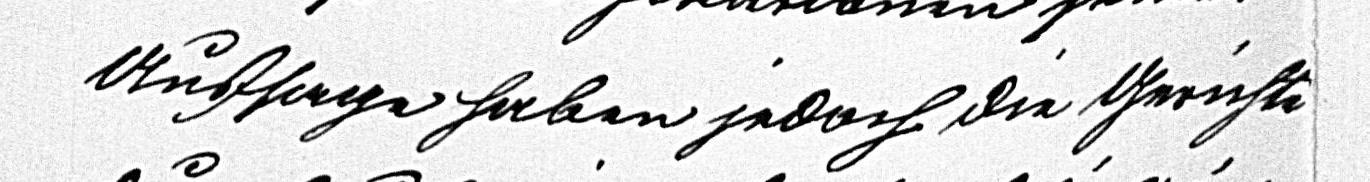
Aussage haben jedoch die Gerichte
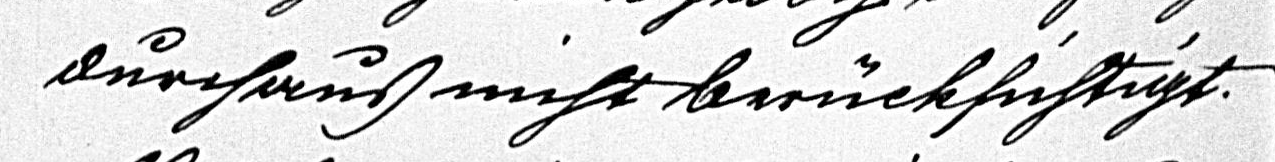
durchaus nicht berücksichtigt.
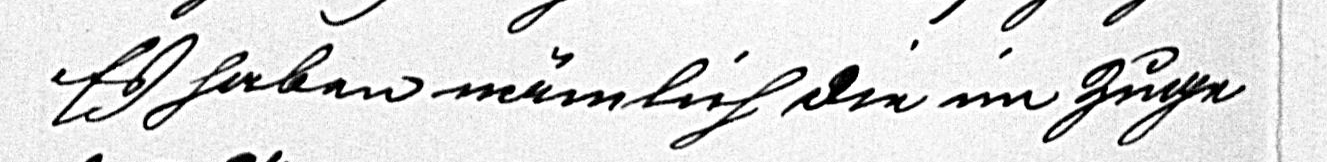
Es haben nämlich die im Zuge
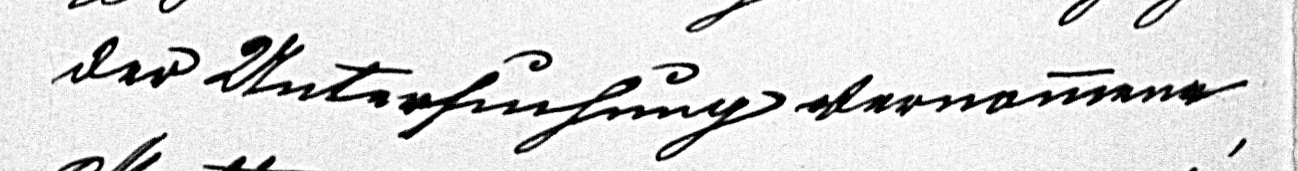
der Untersuchung vernommene
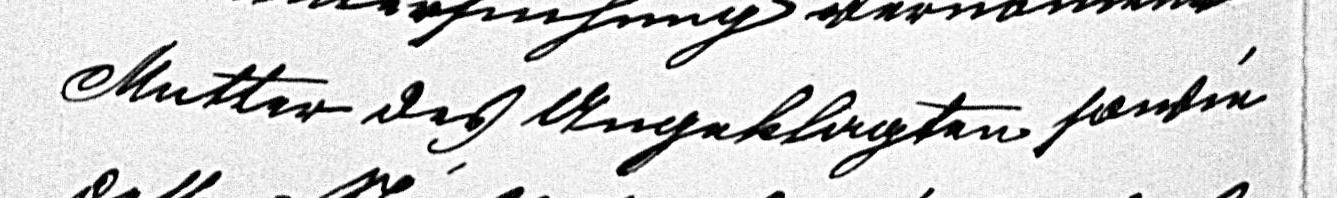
Mutter des Angeklagten sowie
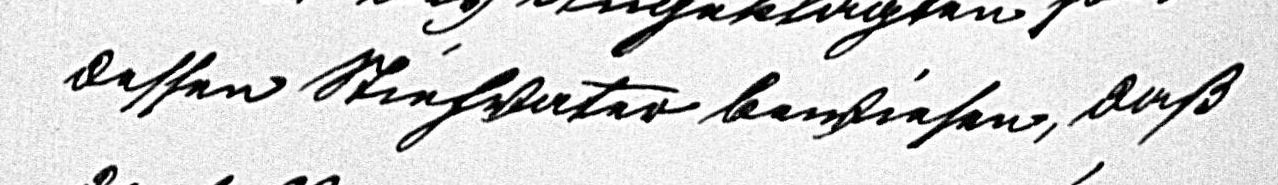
dessen Stiefvater bewiesen, daß
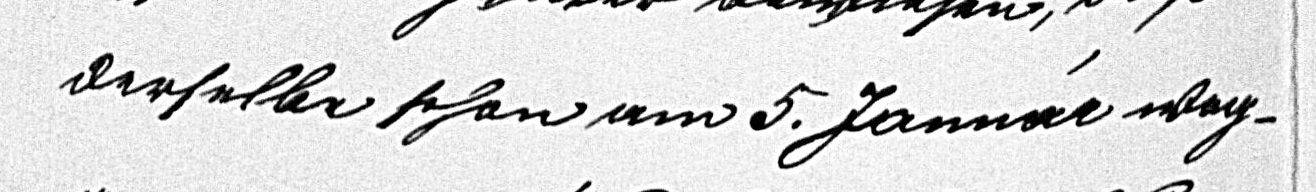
derselbe schon am 5. Január weg¬
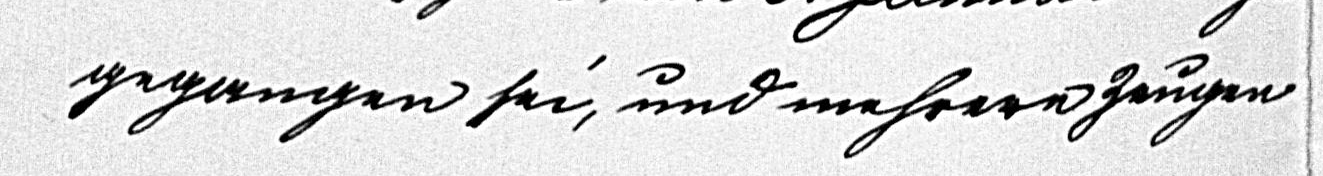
gegangen sei, und mehrere Zeugen
